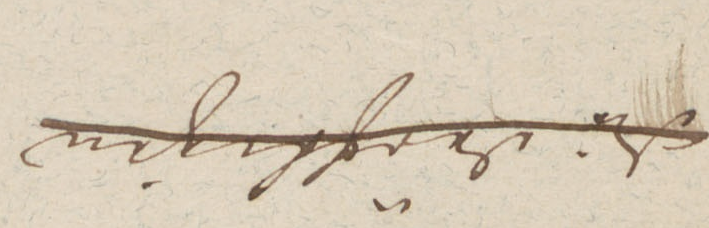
die Spuren an den vorhandenen
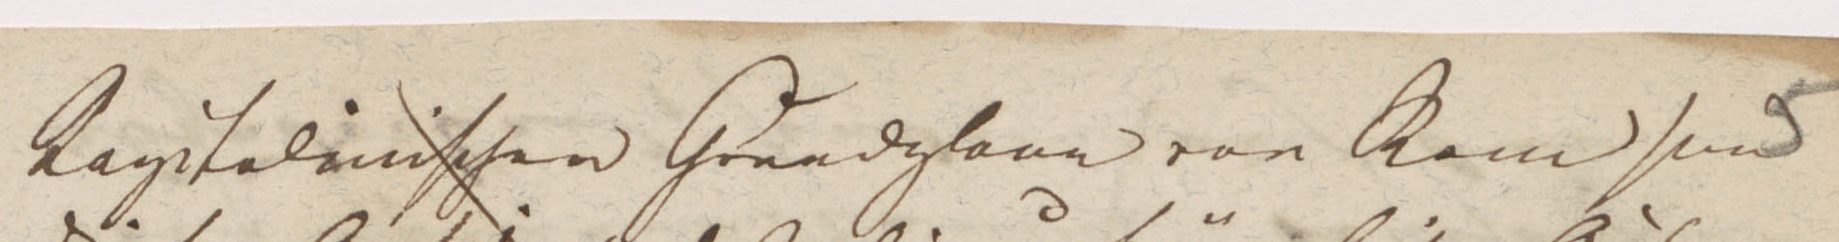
Kapitolinischen Grundplane von Rom sind
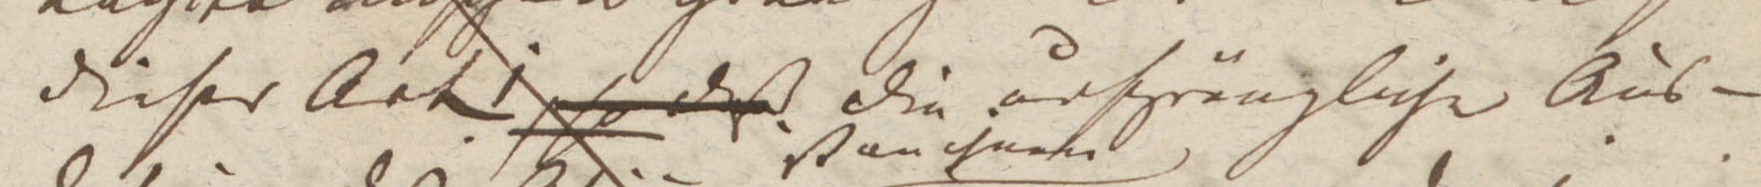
dieser Art, so dass; die ursprüngeliche Aus-
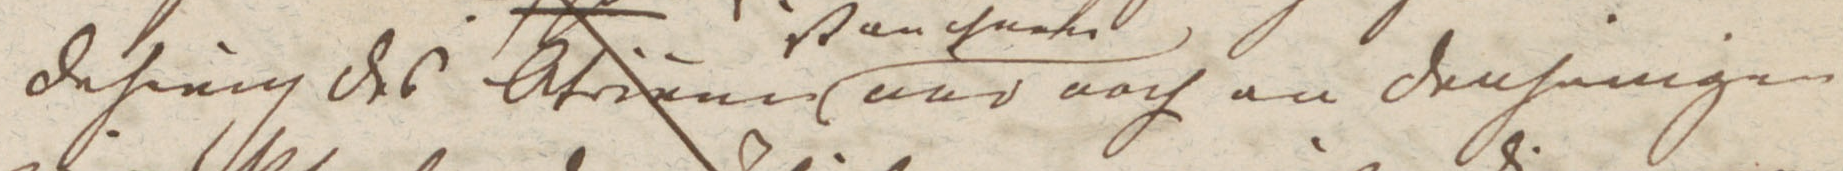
dehnung des Atriums ist an ihnen nur noch an denjenigen
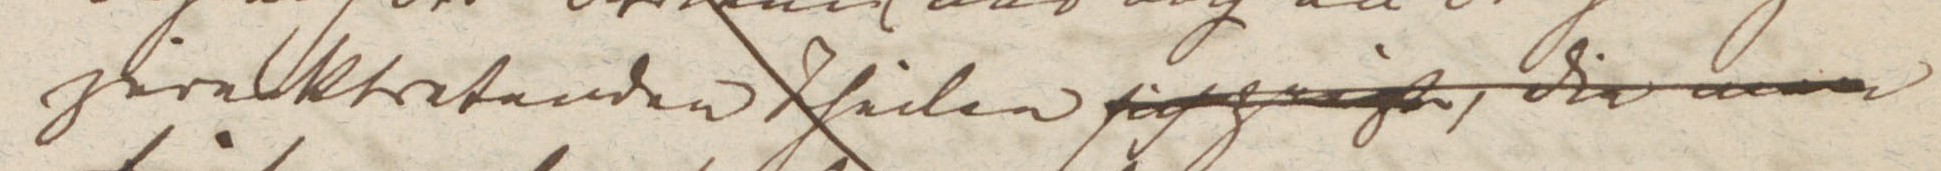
zurücktretenden Theilen sich zeigt, die man
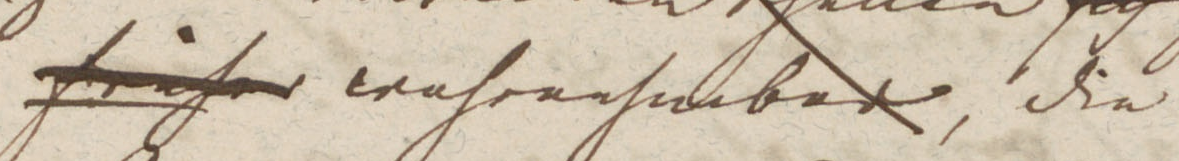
früher wahrnehmbar, die
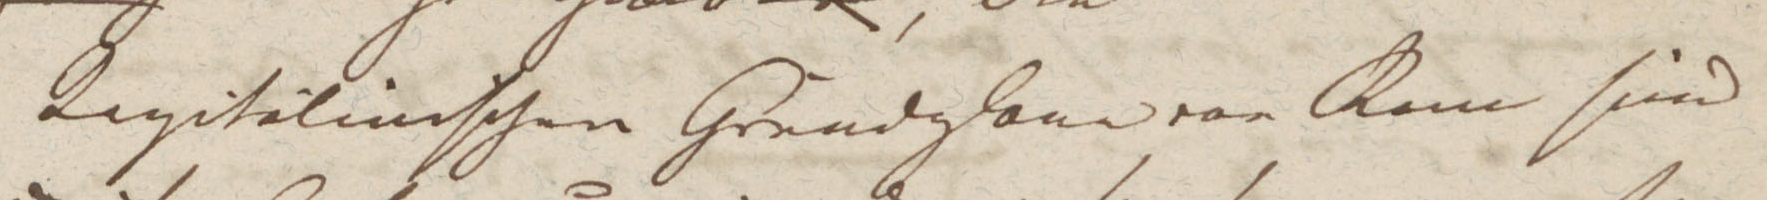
Kapitolinischen Grundplane von Rom sind
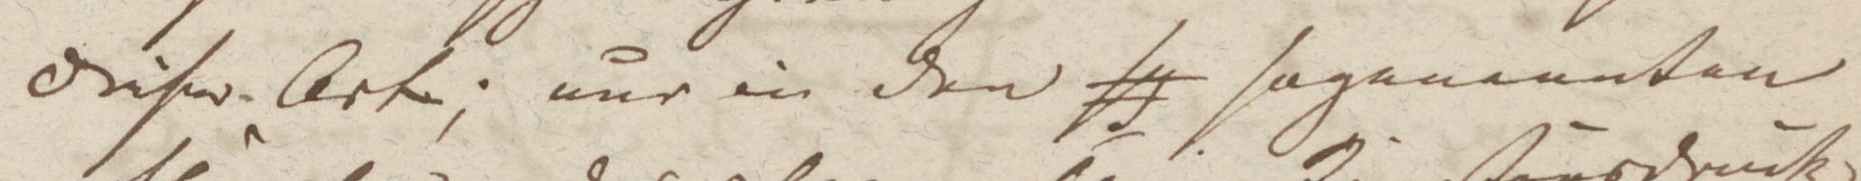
dieser Art; nur in den s sogenannten
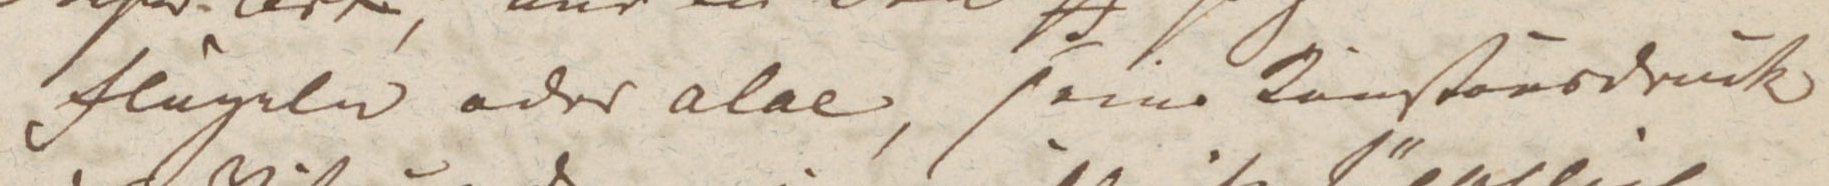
Flügeln oder alae, (ein Kunstausdruck
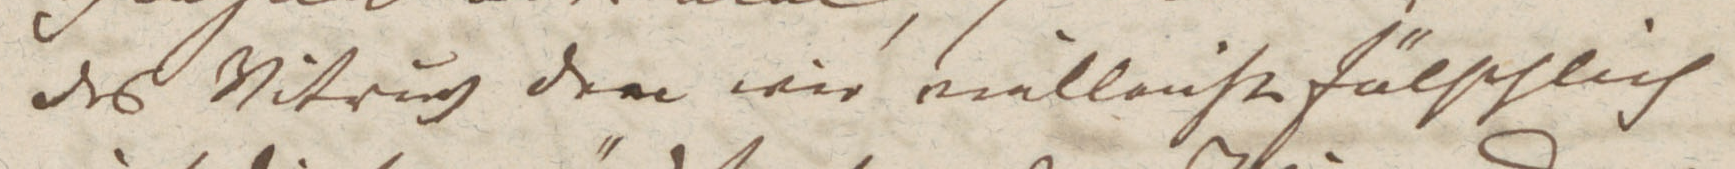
des Vitruv de wir vielleicht fälschlich
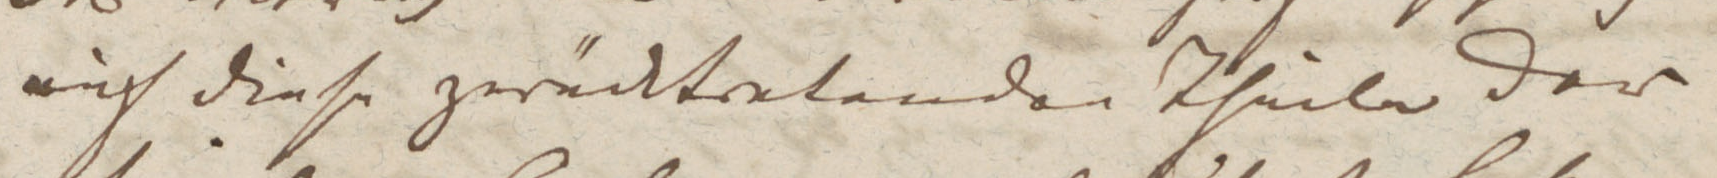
auf diese zurücktretenden Theile der
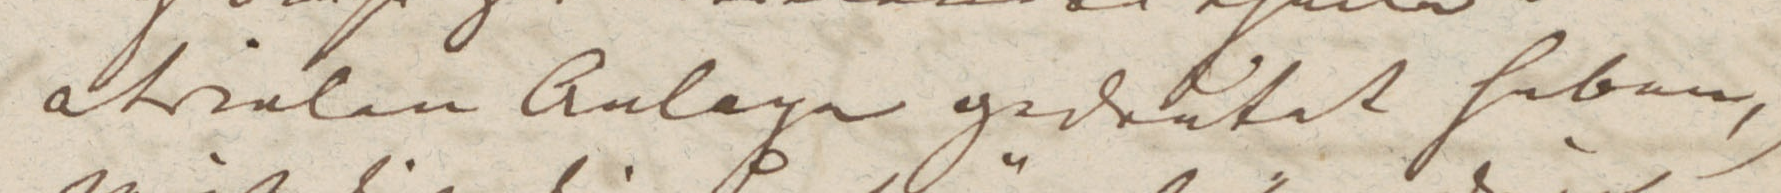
atrialen Anlage gedeutet haben,)
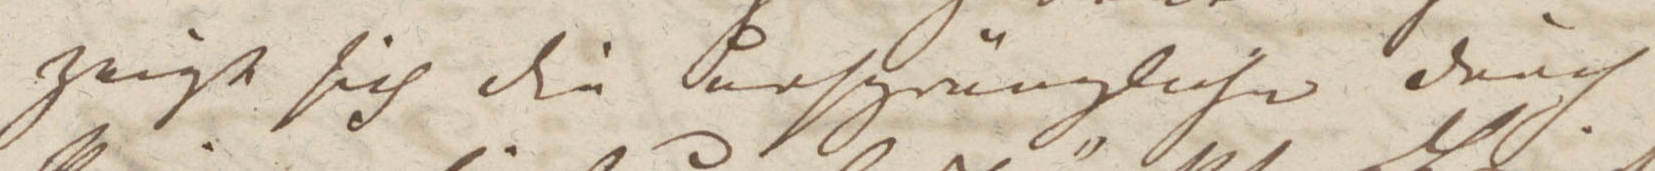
zeigt sich die ursprüngliche durch
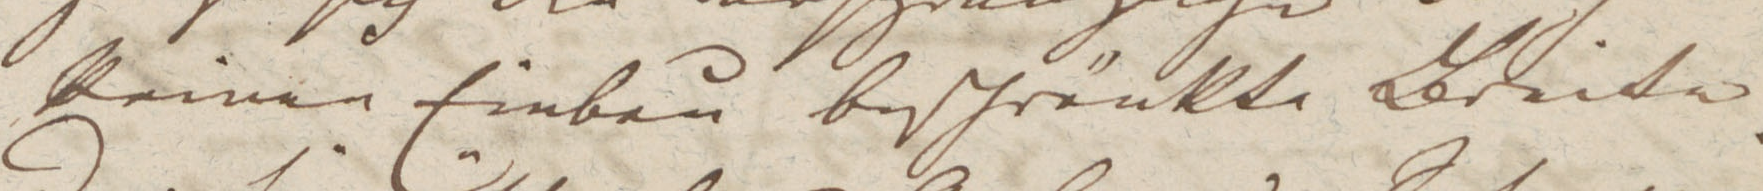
keinen Einbau beschränkte Breite
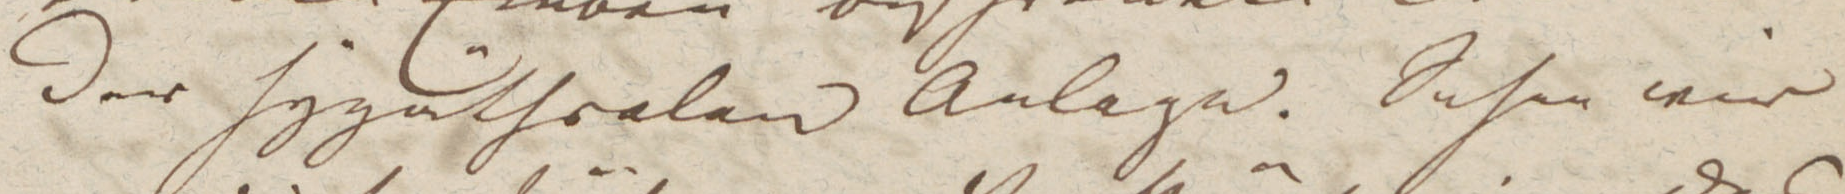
der hypäthralen Anlage. Sehen wir
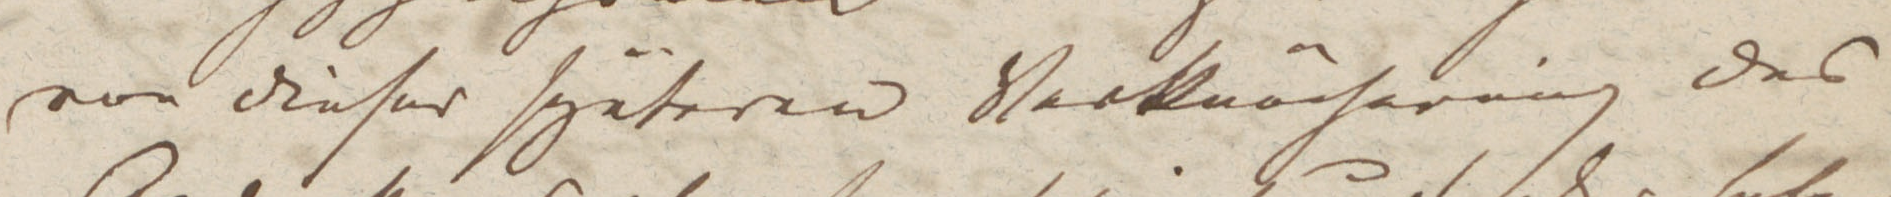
von dieser späteren Verknöcherung des
